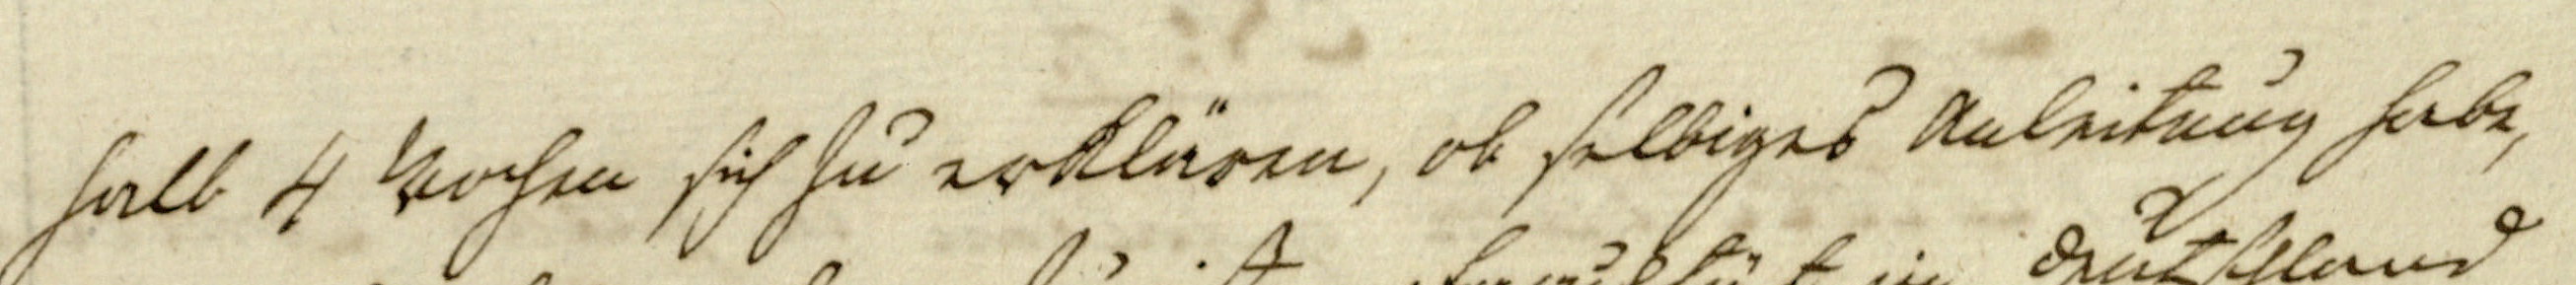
halb 4 Wochen sich zu erklären, ob selbiges Anleitung habe,
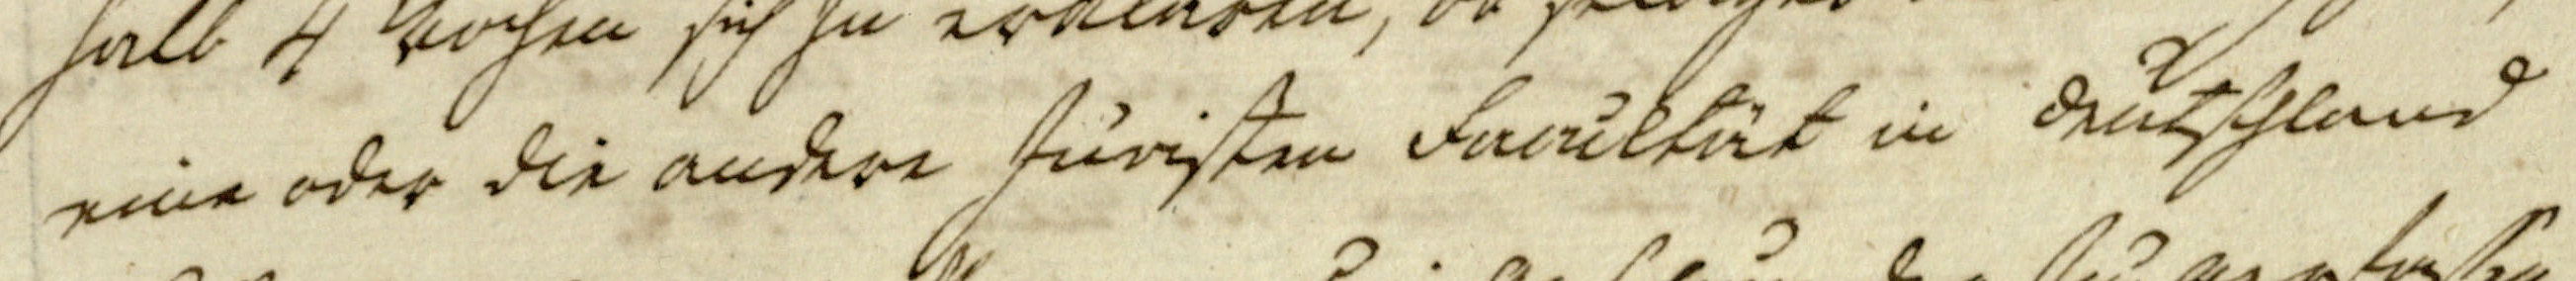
eine oder die andere Juristen Facultät in Deutschland
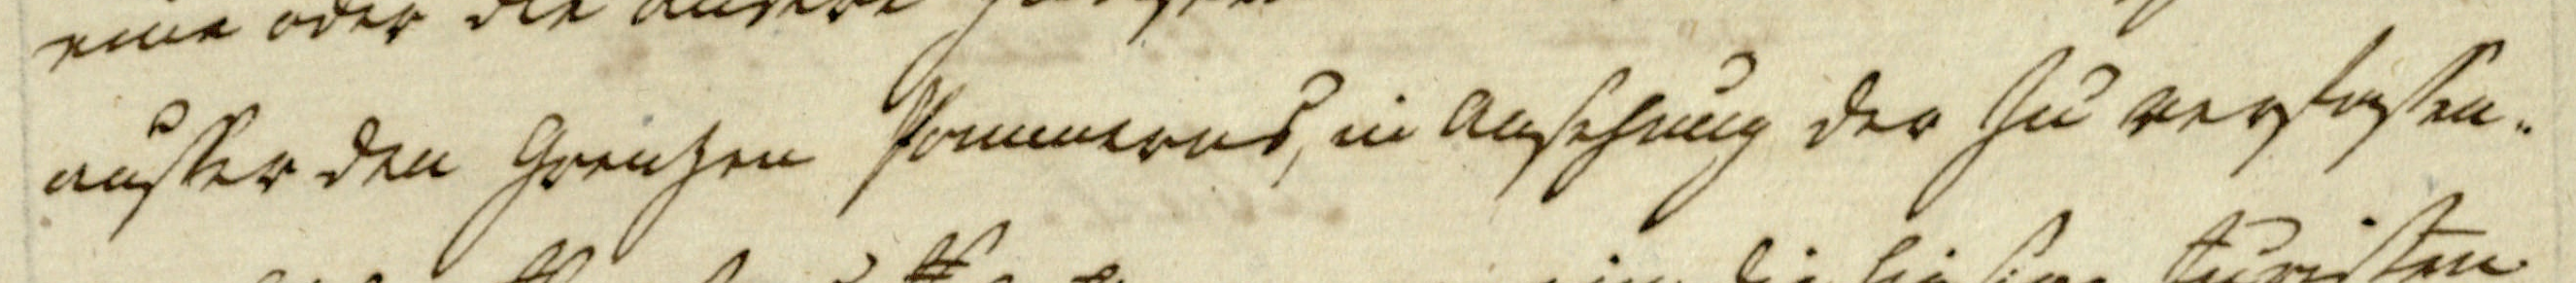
ausser den Grenzen Pommerns, in Ansehung der zu verfassen¬
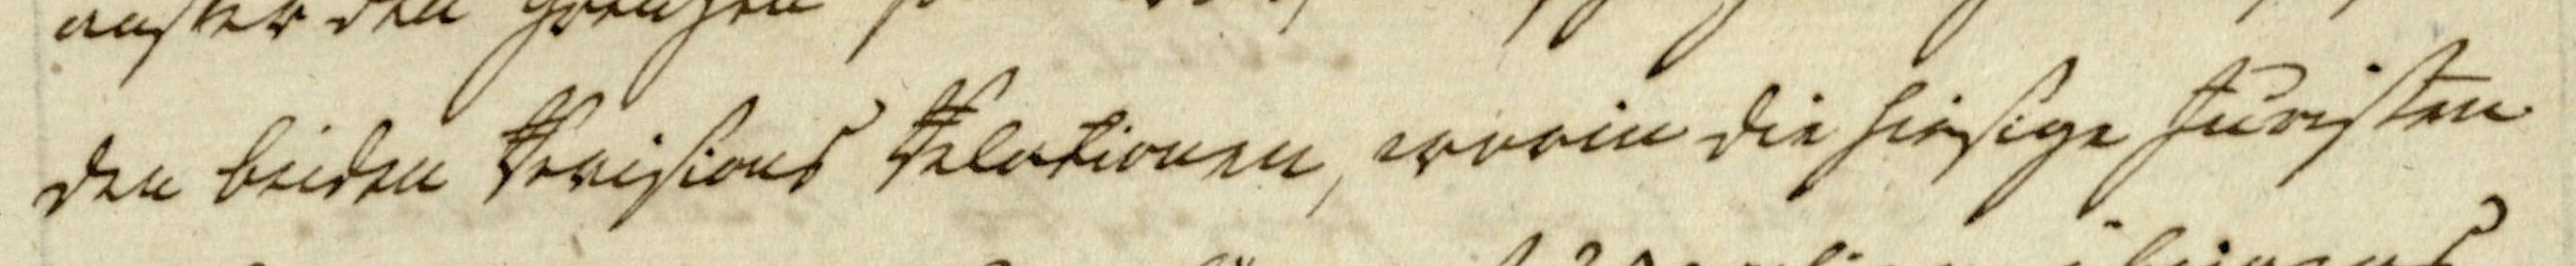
den beiden Revisions Relationen, worin die hiesige Juristen
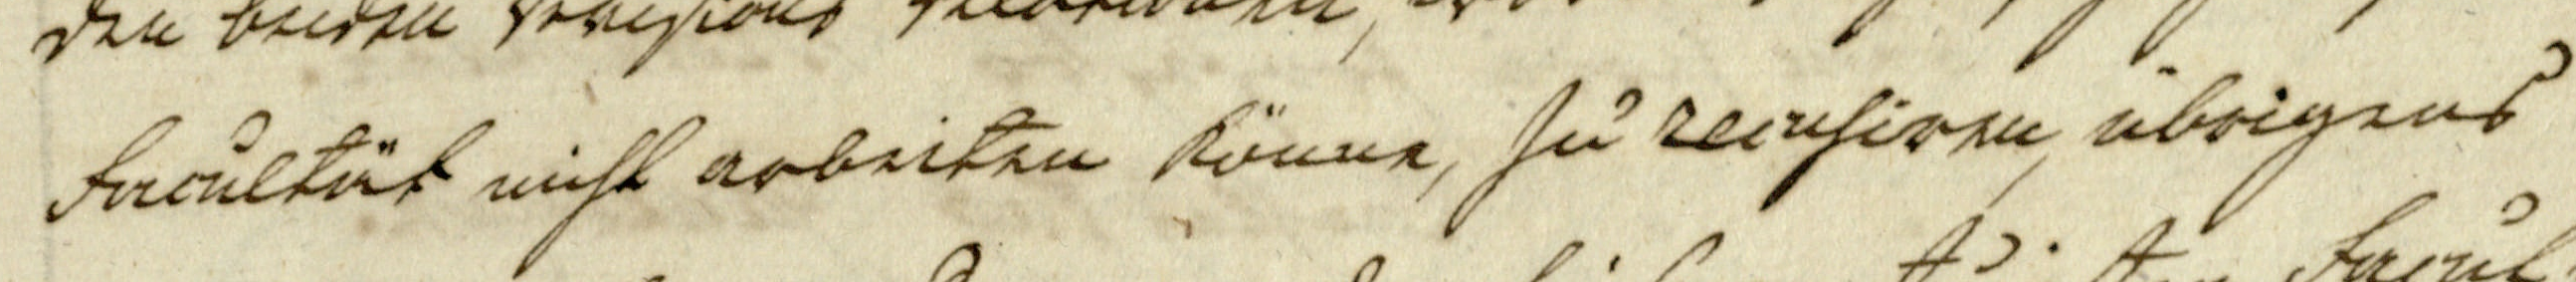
Facultät nicht arbeiten könne, zu recusiren, übrigens
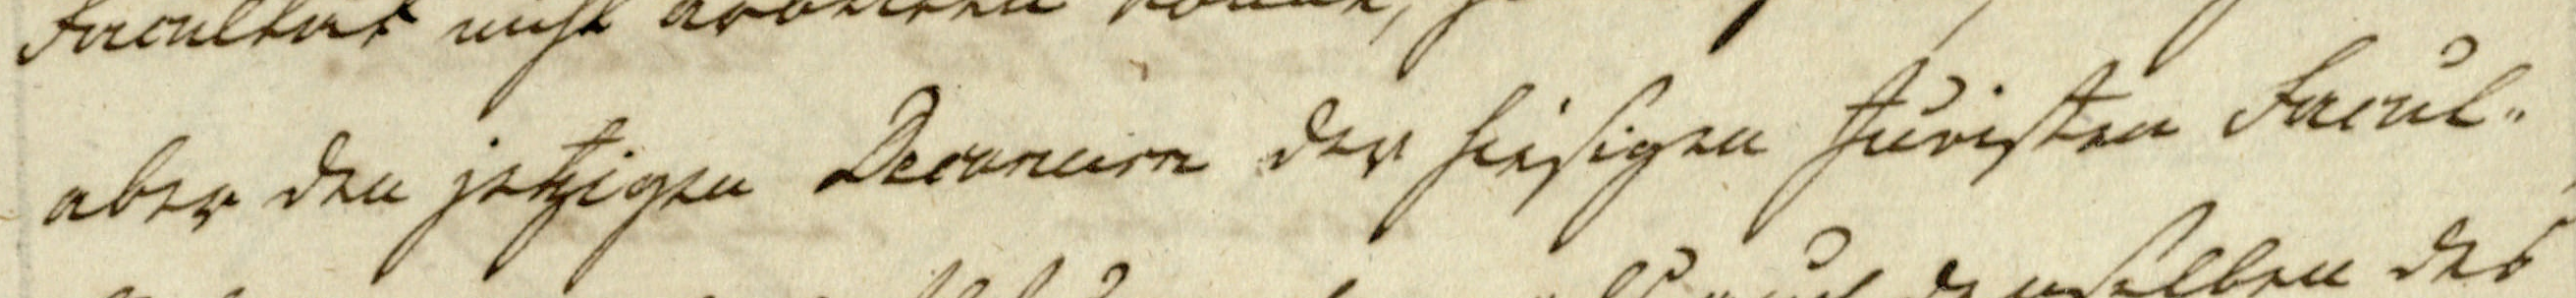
aber den jetzigen Decanum der hiesigen Juristen Facul¬
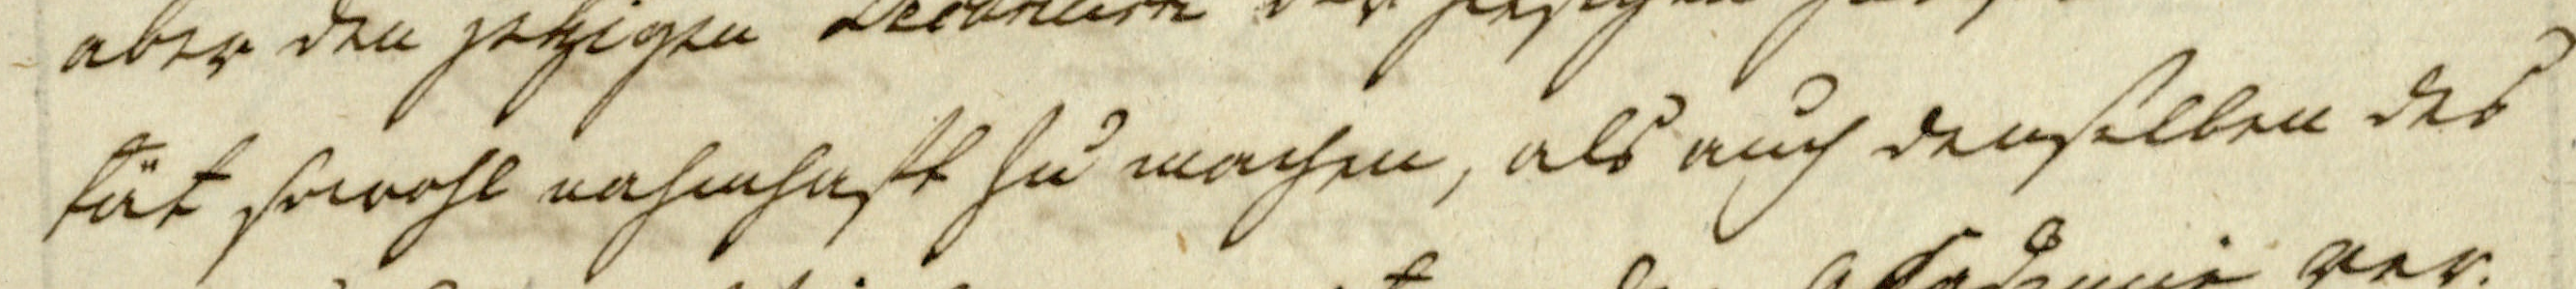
tät sowohl nahmhaft zu machen, als auch denselben des
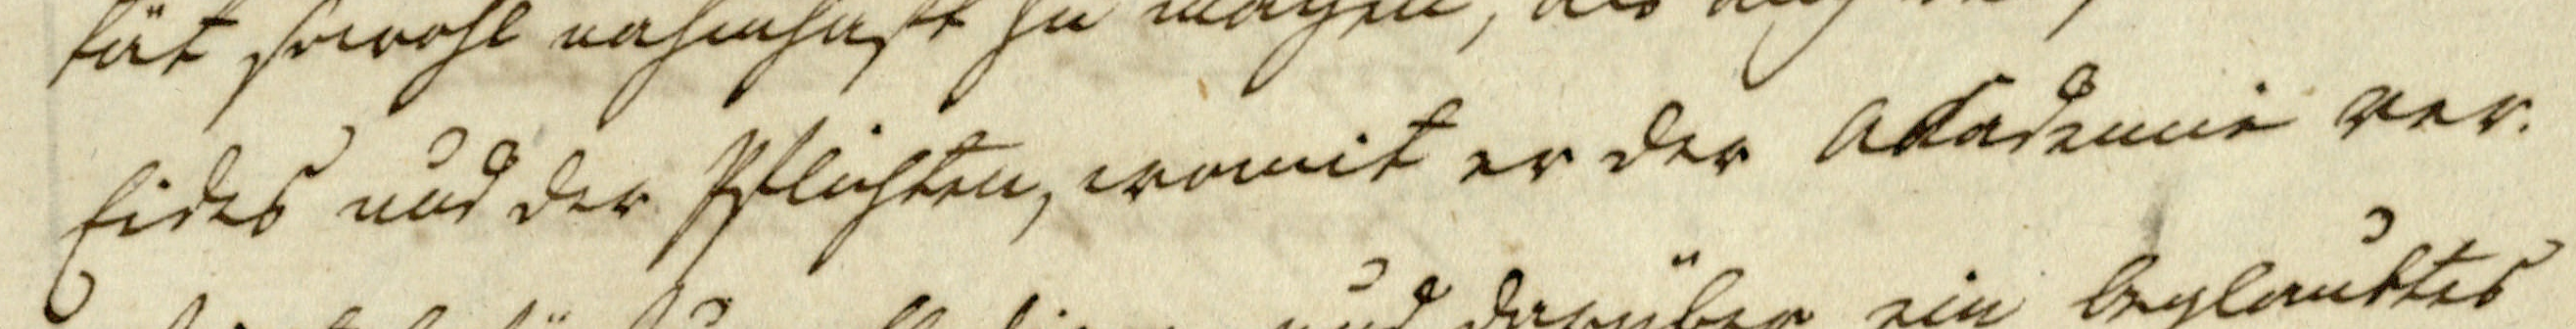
Eides und der Pflichten, womit er der Akademie ver¬
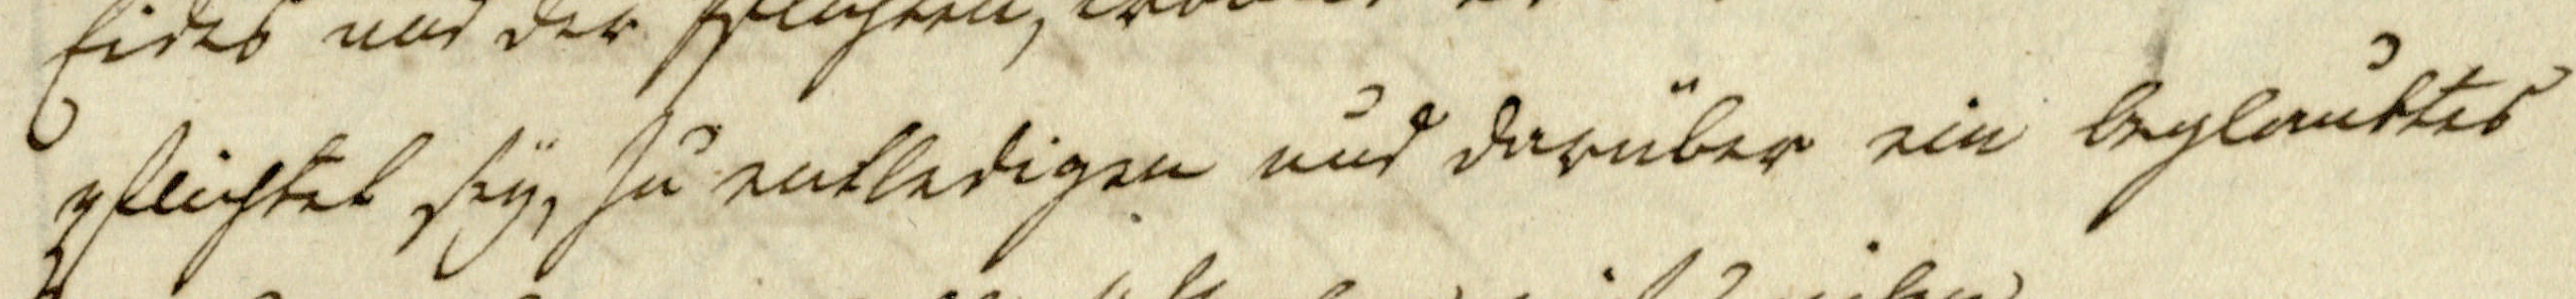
pflichtet seÿ, zu entledigen und darüber ein beglaubtes
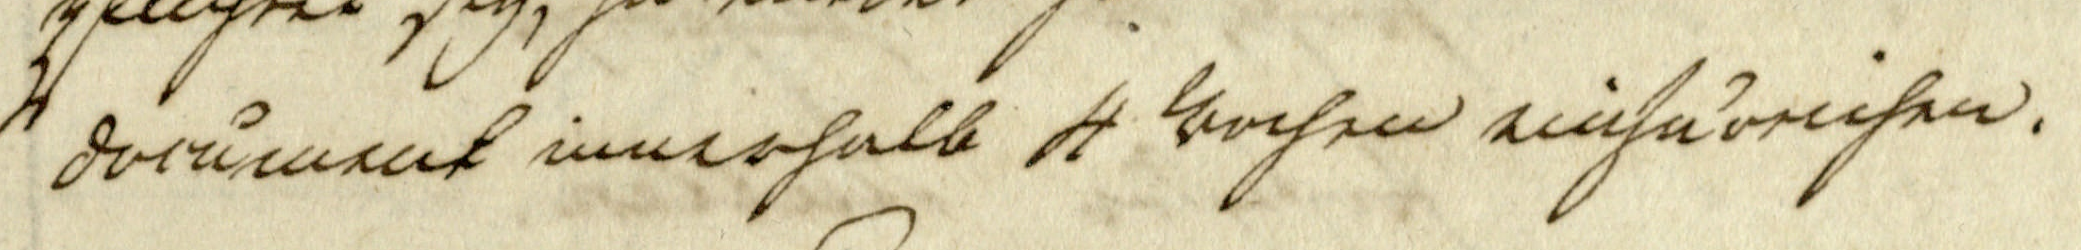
Document innerhalb 4 Wochen einzureichen.
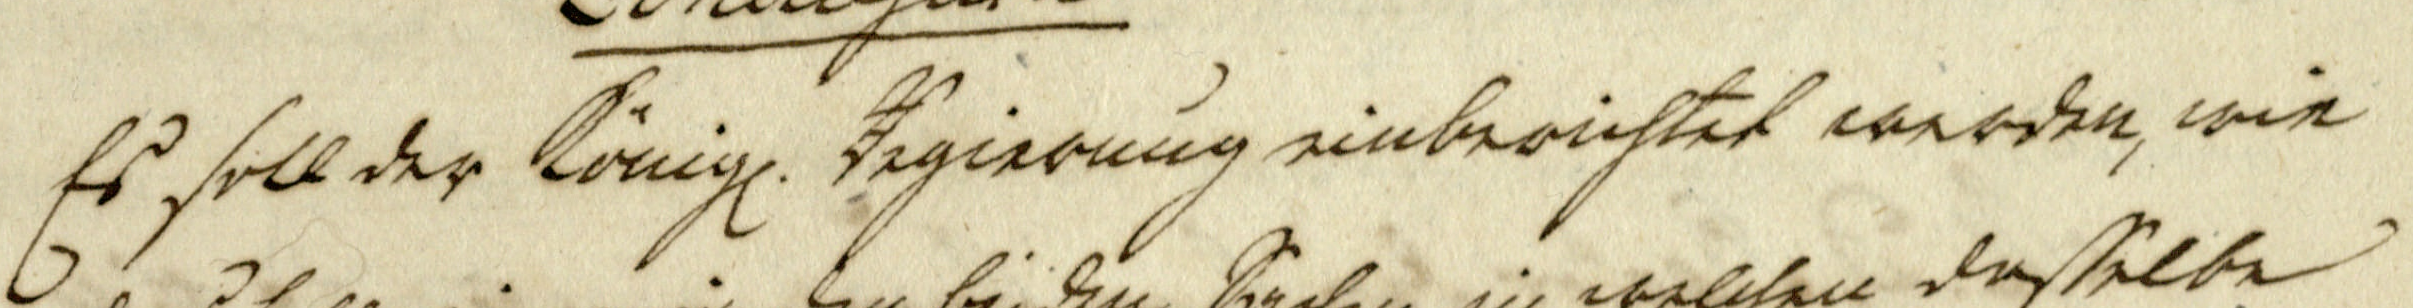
Es soll der Königl. Regierung einberichtet werden, wie
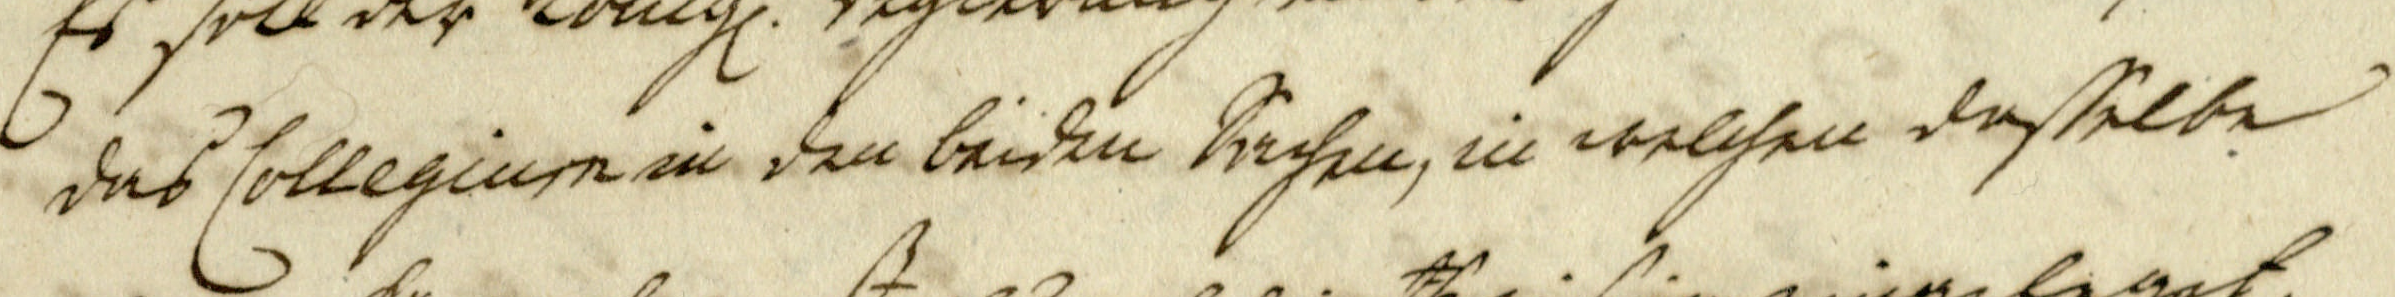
das Collegium in den beiden Sachen, in welchen dasselbe
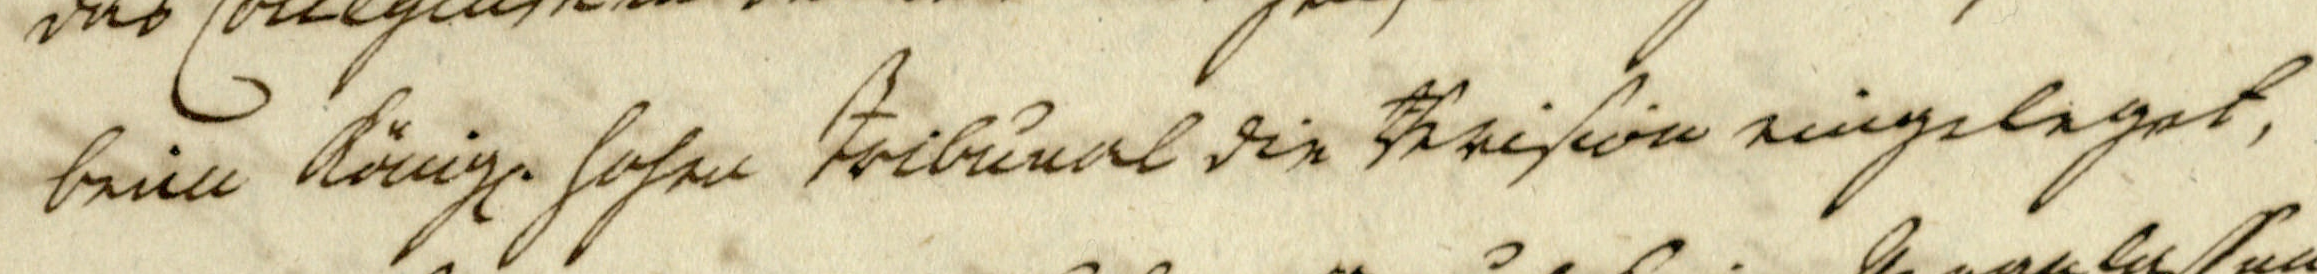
beim Königl. hohen Tribunal die Revision eingeleget,
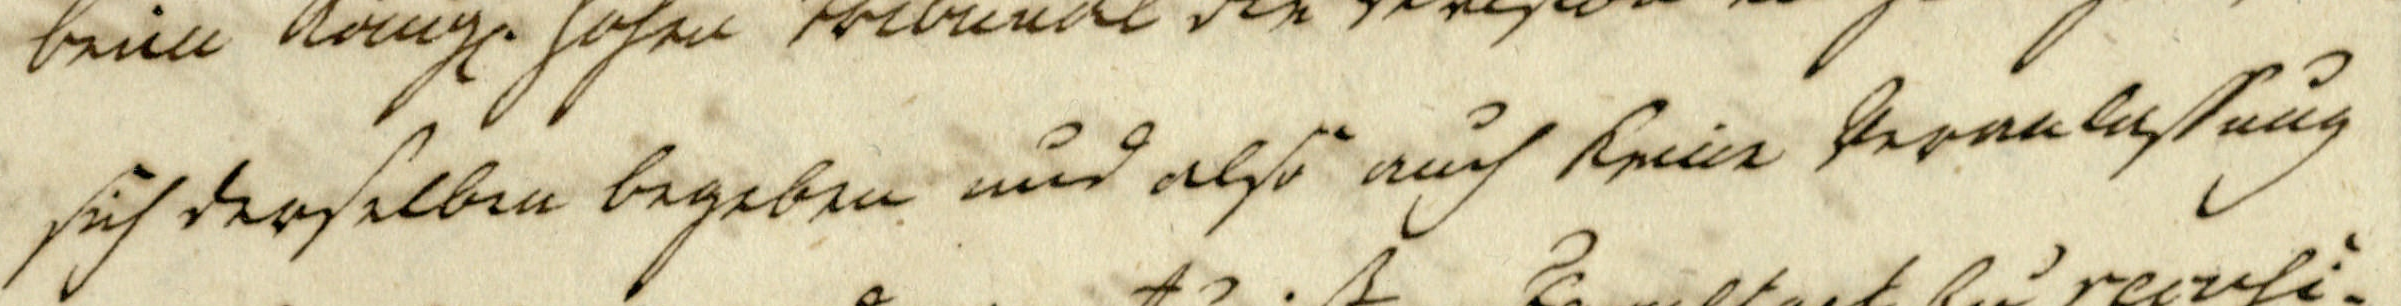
sich derselben begeben und also auch keine Veranlassung
